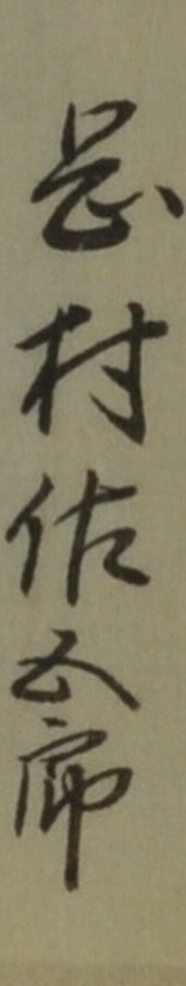岡村佐五郎
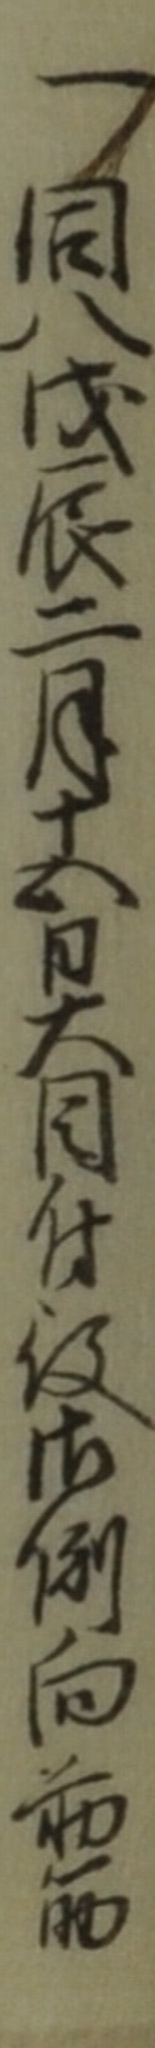一同八戊辰二月十五日大目付役御側向勤筋
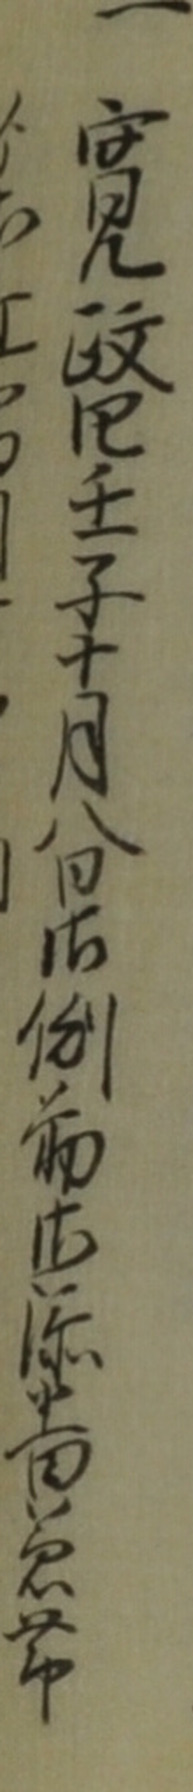一寛政四壬子十月八日御側勤御添番兼帯
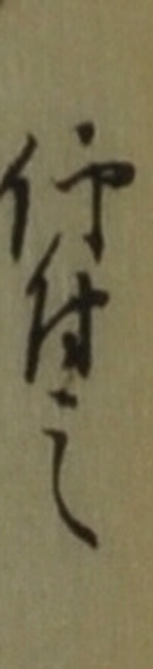仰付之
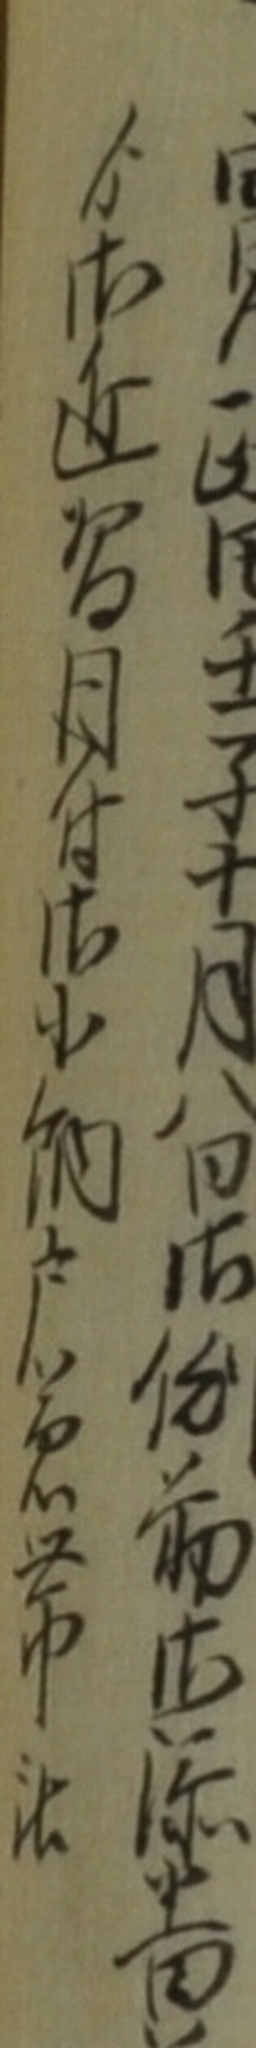ゟ御近習目付御小納戸兼帯被
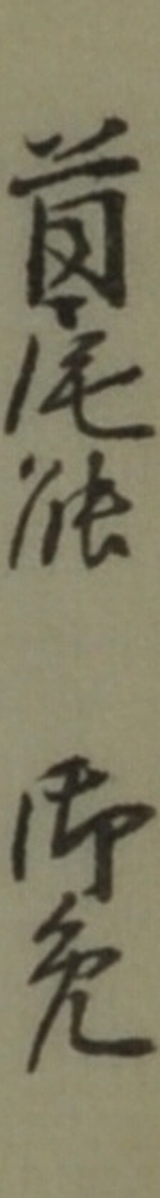首尾能御免
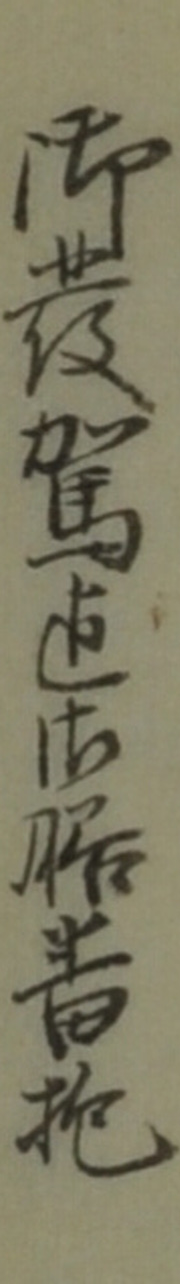御発駕迄御膳番抱
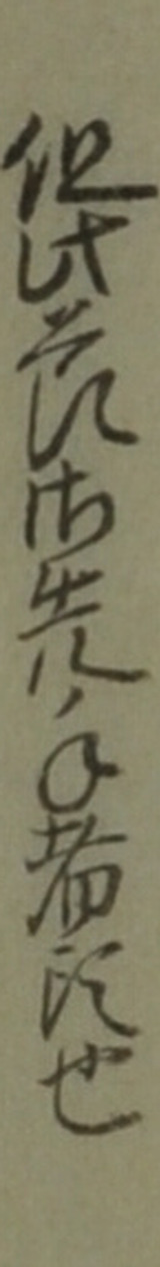但此節御先手者頭也
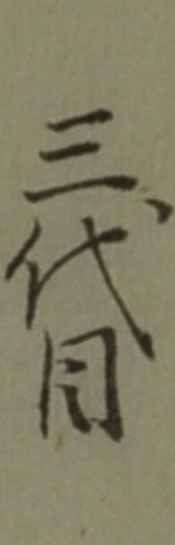三代目
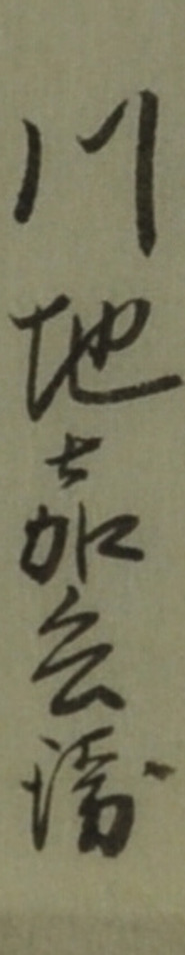川地嘉兵衛
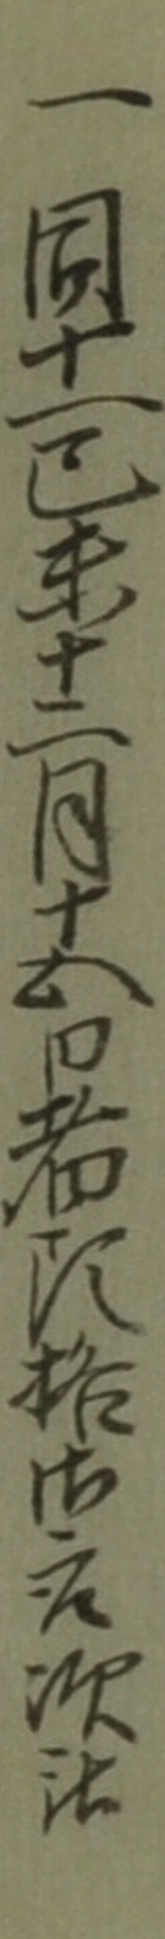一同十一己未十二月十五日物頭格御取次被
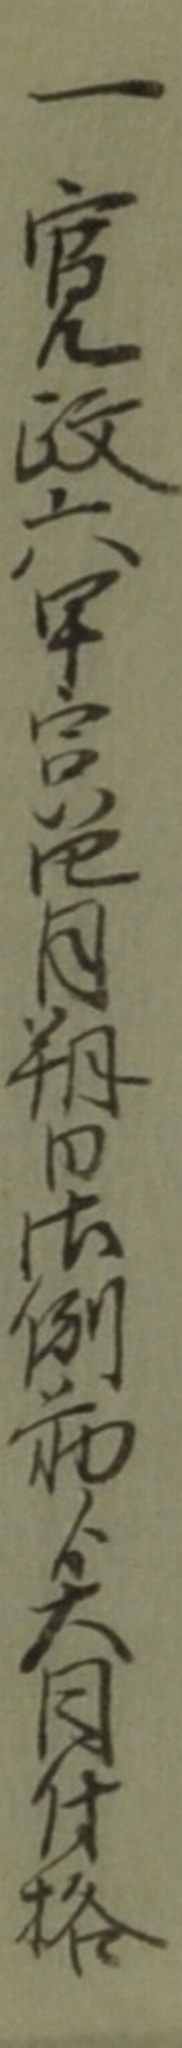一寛政六甲寅四月朔日御側勤ゟ大目付格
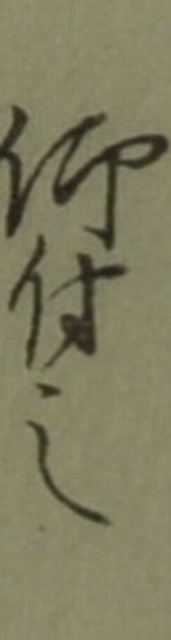仰付之
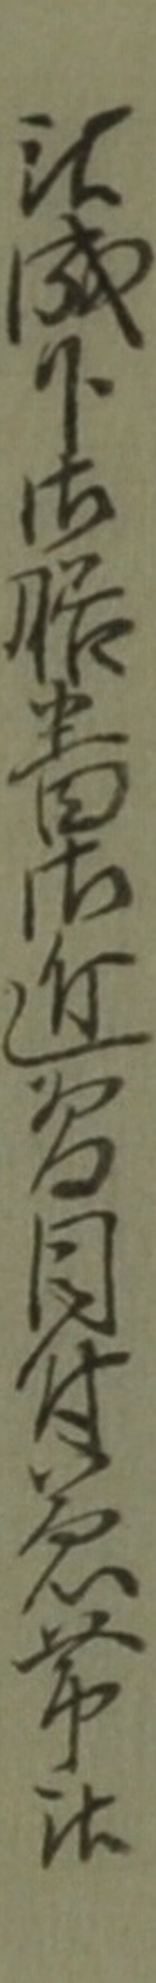被成下御膳番御近習目付兼帯被
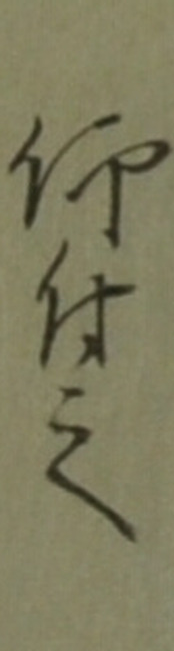仰付之
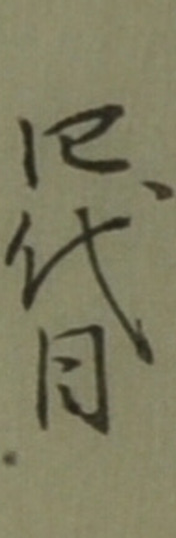四代目
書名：諸御役代々録（四）
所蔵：伊那市立高遠町図書館・合同会社AMANE
